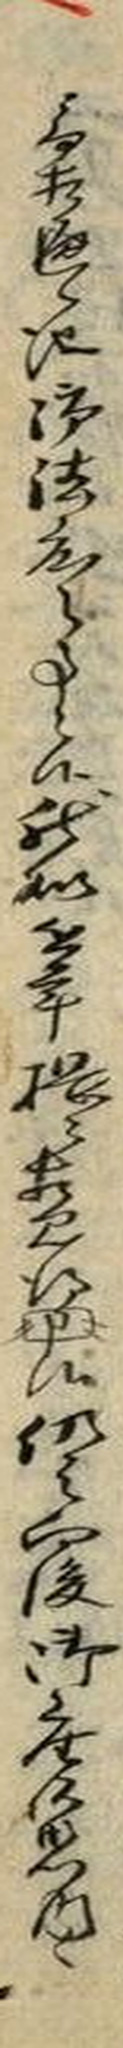に而相通候儀御法度之事に候然処近年猥に相見得候仍之向後御座所御門内へ

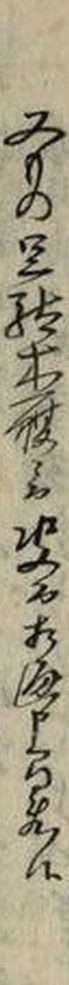又もの足駄木履に而決而相通申間敷候
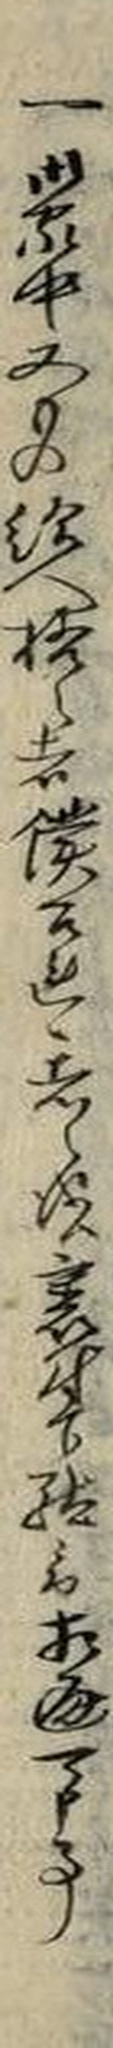一御家中又もの給人格之者僕召連候者之儀は裏付下駄に而相通事
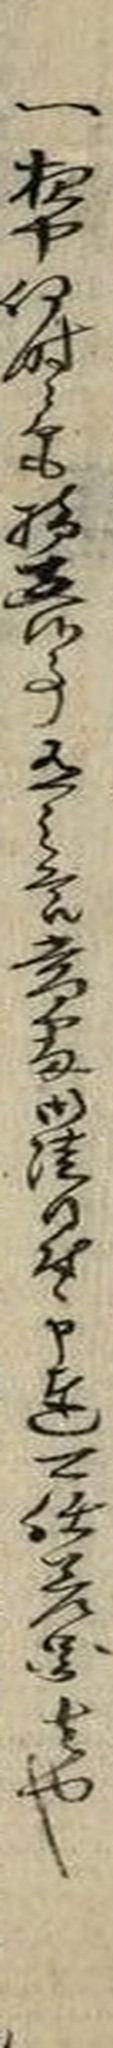一夜中何時に而も指支候事有之節当番御徒目付へ申達可任差図者也
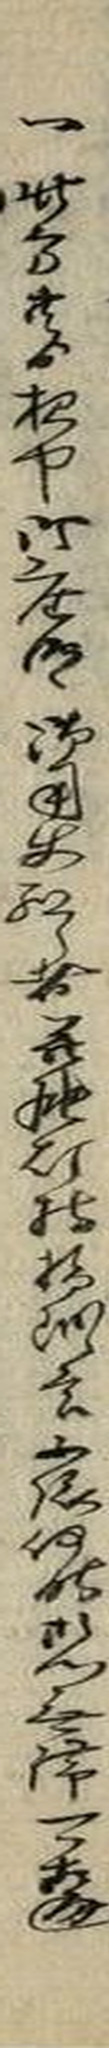一此方共ゟ夜中御座所へ御用使組之者并挑灯持指越候節不依何時御門無滞可相通
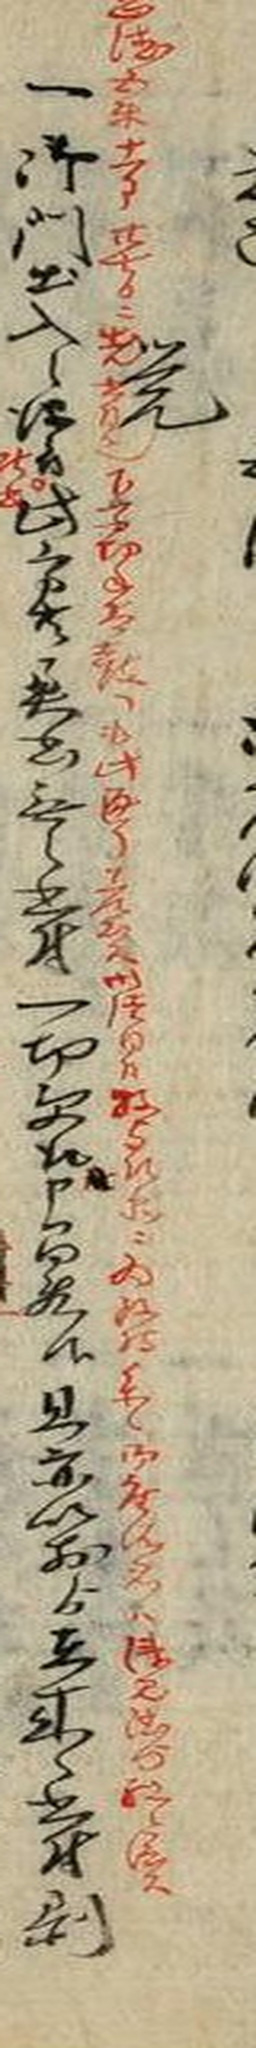一御門出入之儀に付断書此方共奥書無之書付一切受取申間敷候且亦以前ゟ在来候書付剥
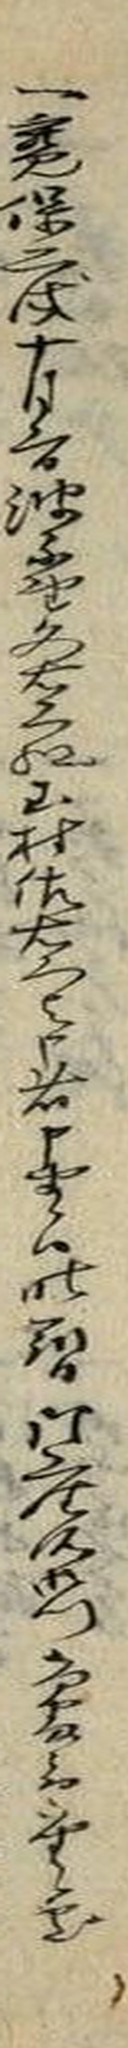一寛保二戌十月二日波多野文右衛門組玉村佐右衛門と申者申聞候は昨朔日御座所御門当番に而御座候処
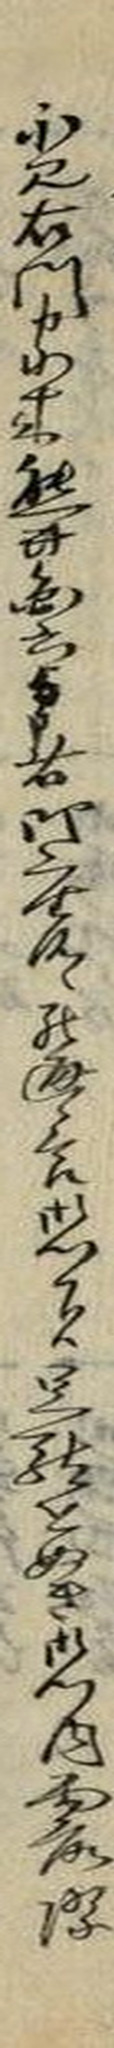永見右門家来熊井円六と申者御座所へ罷通候節御門下は足駄をぬき御門内雨落際
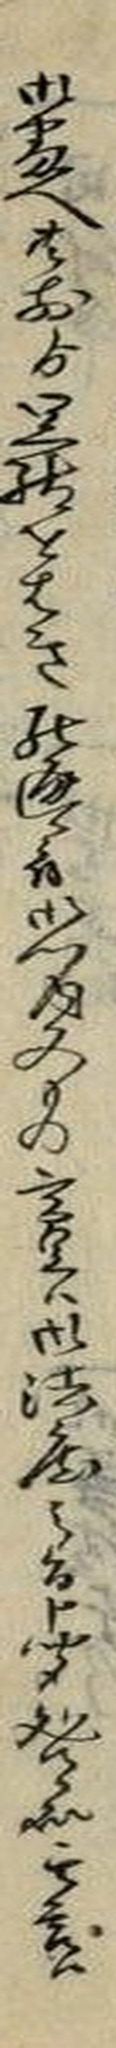御番人共前ゟ足駄をはき罷通候付御門内又もの高足は御法度之旨申聞咎候処其節は
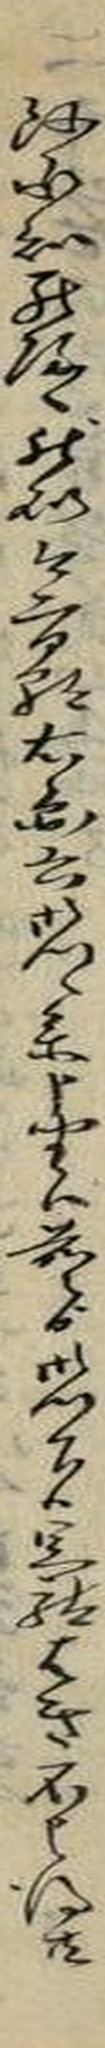致承知罷帰候然処今二日朝右円六御門へ参申聞候は前々ゟ御門下は足駄はき不申候得共
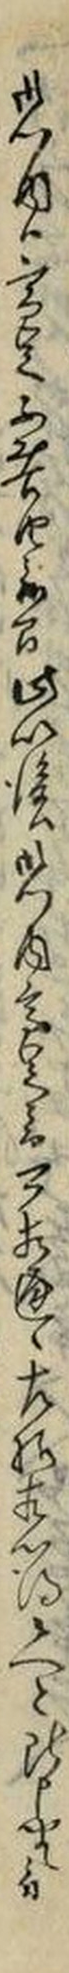御門内は高足不苦候由に候間此以後は御門内高足に而可相通候左様相心得候へと断申聞候に付
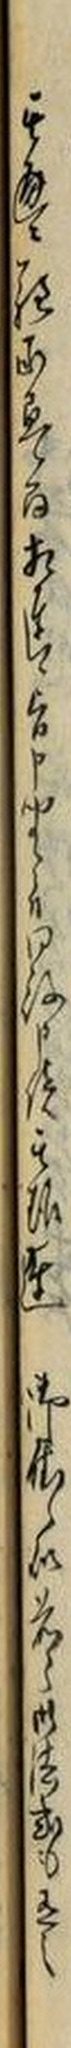其通に難承置候間相達候旨申聞候に付同役申談其趣達御聴候処前々御法式も有之
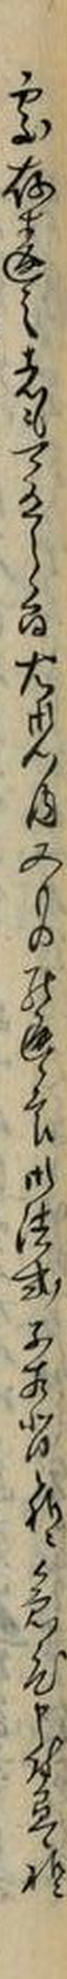処存違之者も可有之候間右御門内又もの罷通候節御法式不相背候様に急度申付置候様
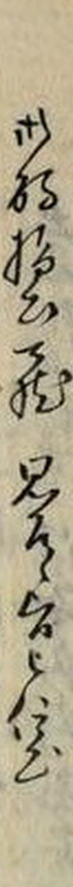御触指出可然思召之旨被仰出
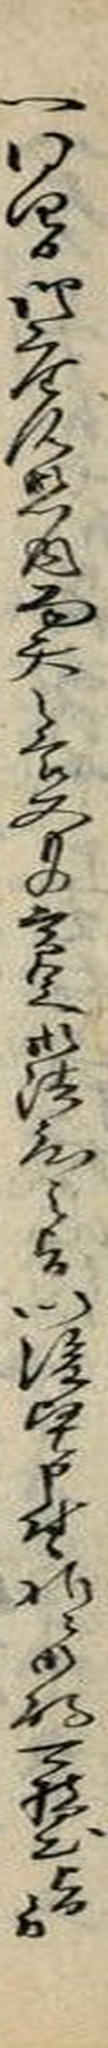一同四日御座所御門内雨天之節又もの高足御法度之旨以後堅申付候様ニ御触可指出候旨に付
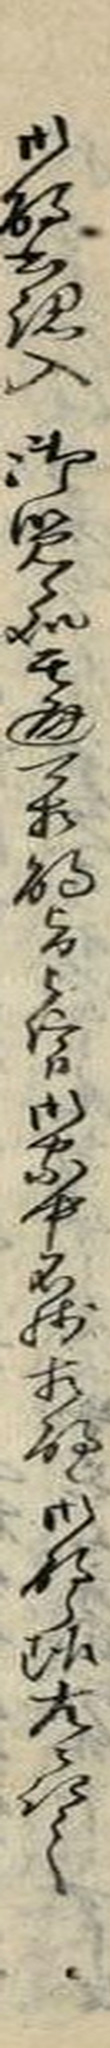御触書認入御覧候処其通可相触旨被仰付御家中不残相触候御触之趣左に記之
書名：御門御櫓之部
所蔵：福井県文書館 Fukui Prefectural Archives
